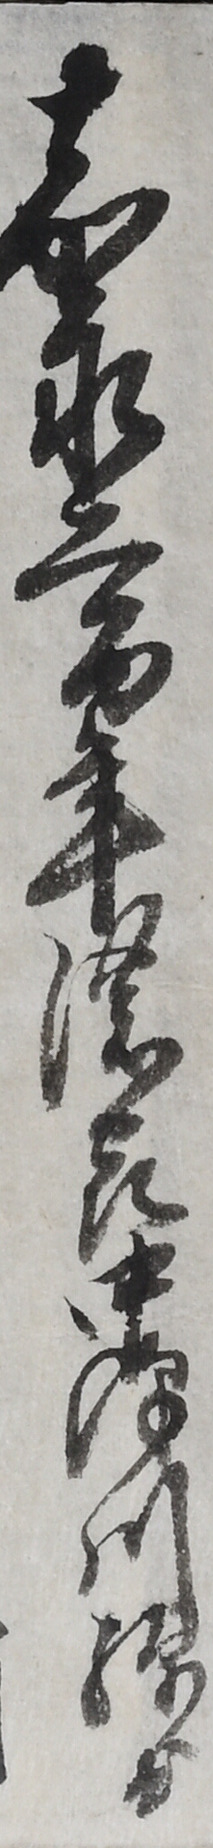嘉永二酉年濃州中津川孫ゟ
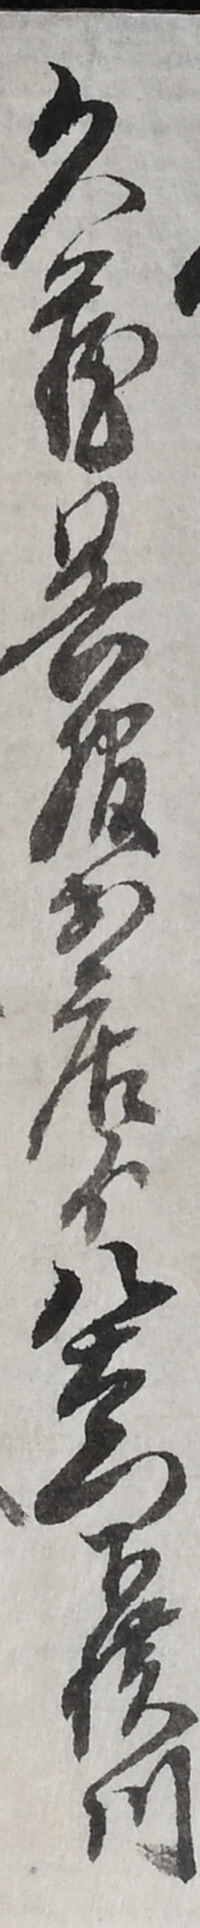久蔵同出店より八右衛門下横川
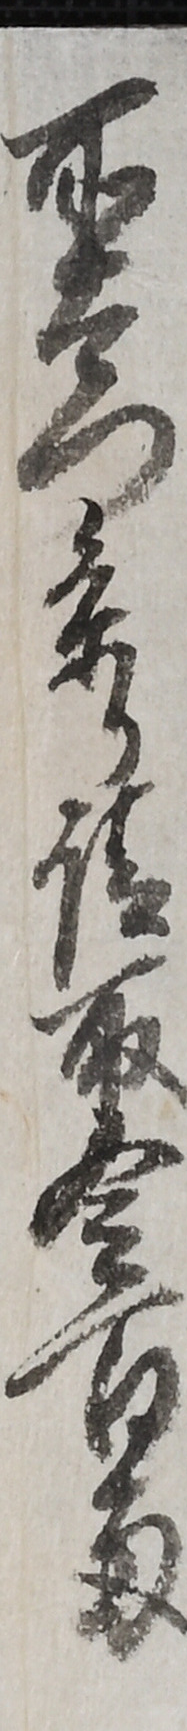所右衛門参り請取金百両
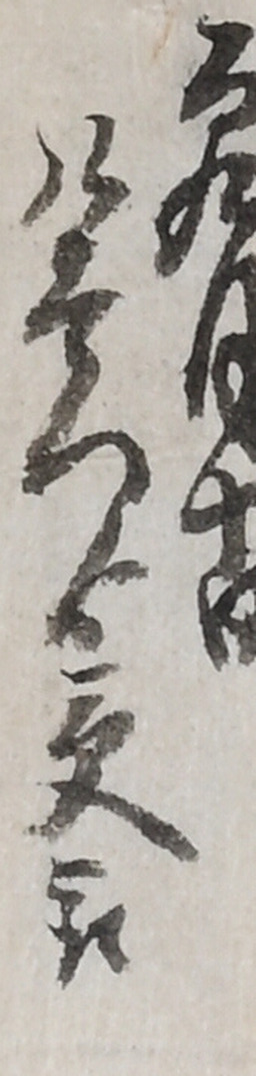八右衛門より受取
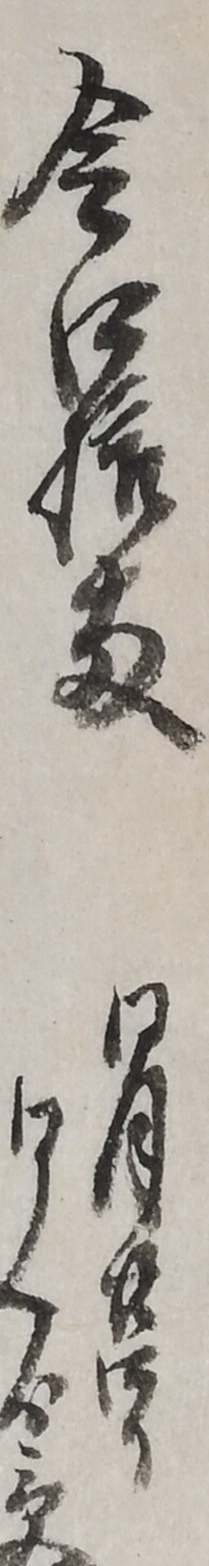金四拾両同月廿四日
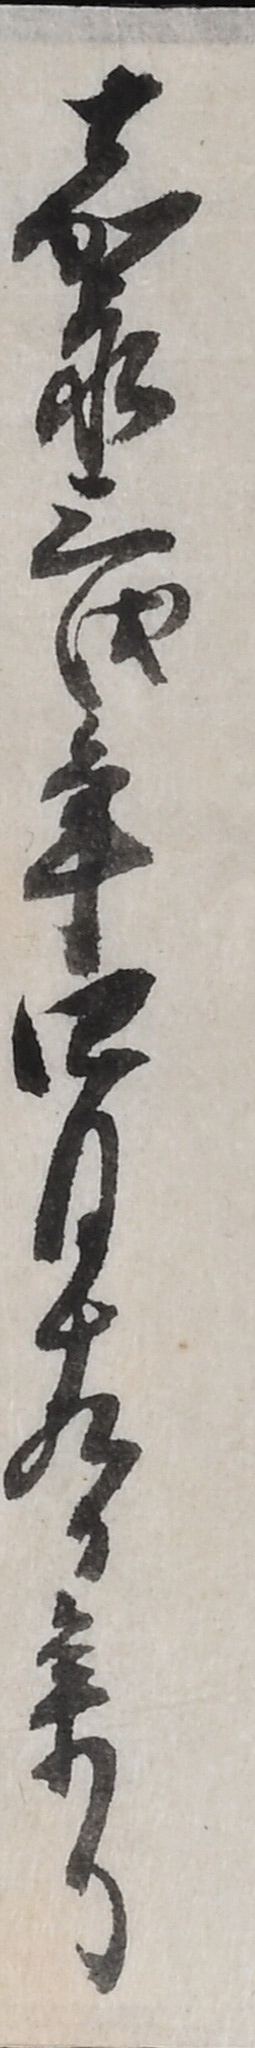嘉永三戌年四月十九日参り
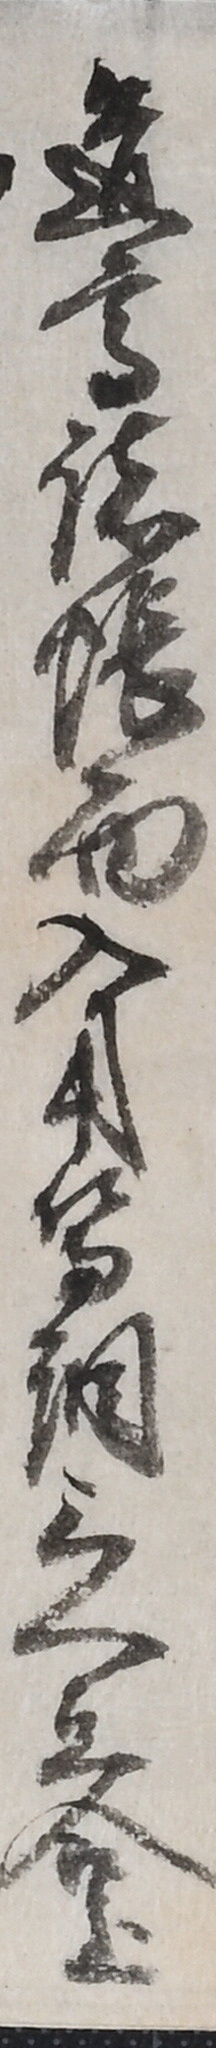造高諸帳面入用賃調三人立合止
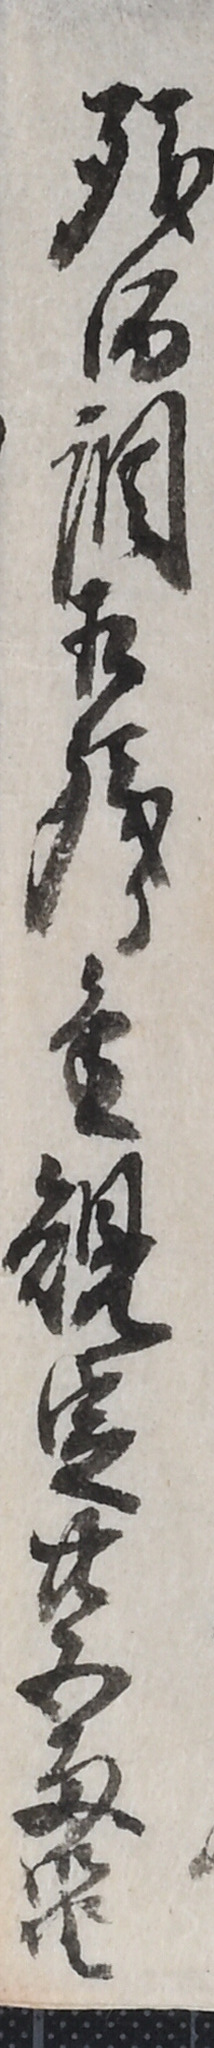残酒調相残り主規定廿五両御坐
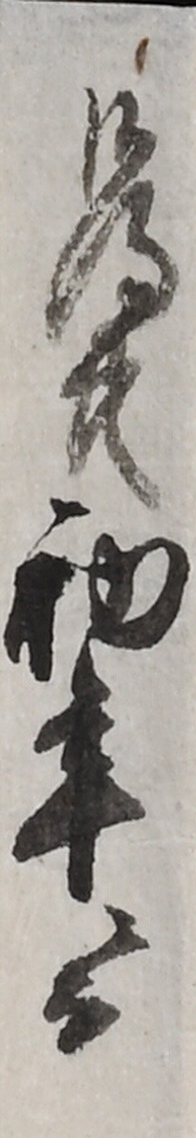候得共初年ニ而
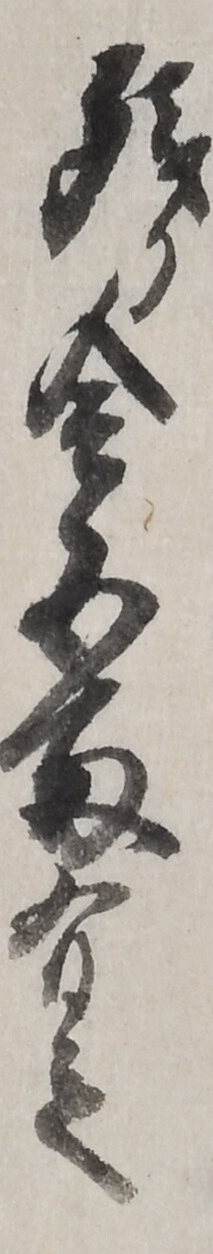残り金五両有之
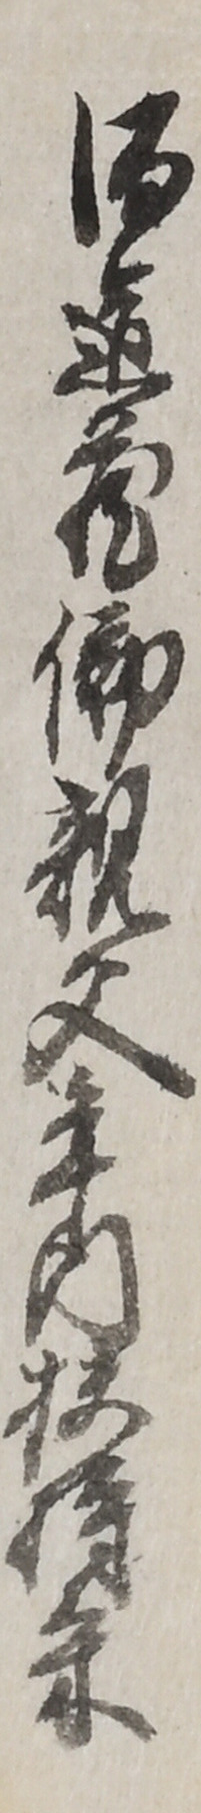酒造蔵働親父年内扶持米
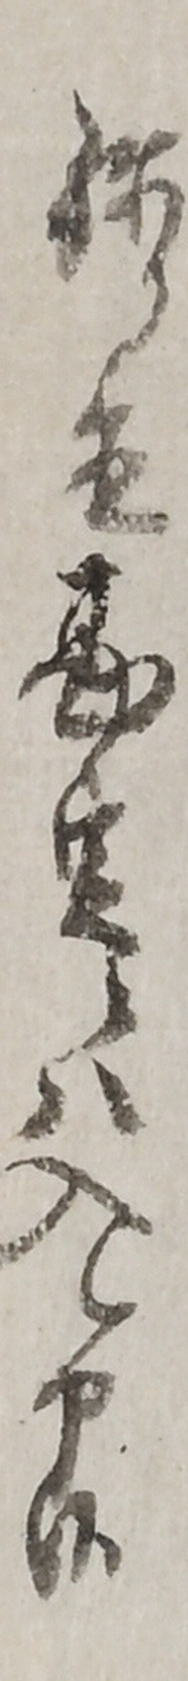残り置勘定ニハ入レ申候
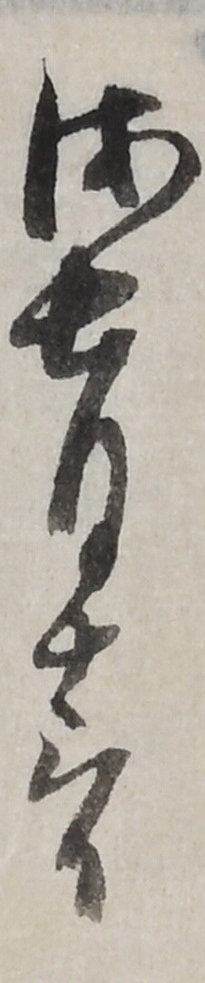戌七月十三日
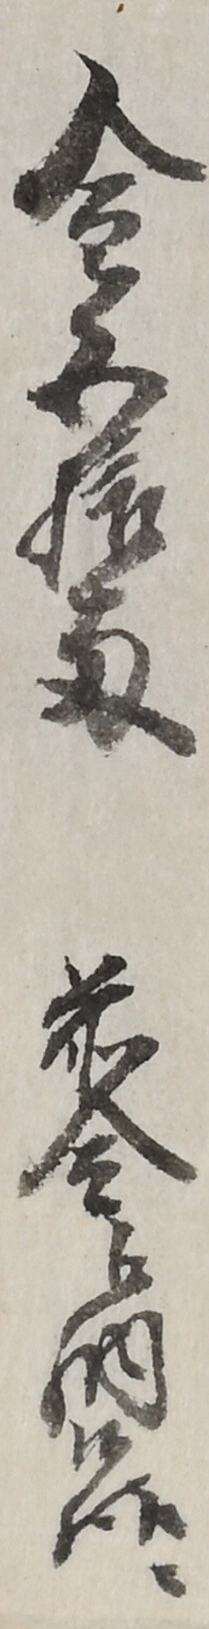金五拾両前金江納候様ニ
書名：（貸借金出入一件覚）
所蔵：伊那市立高遠町図書館・合同会社AMANE
